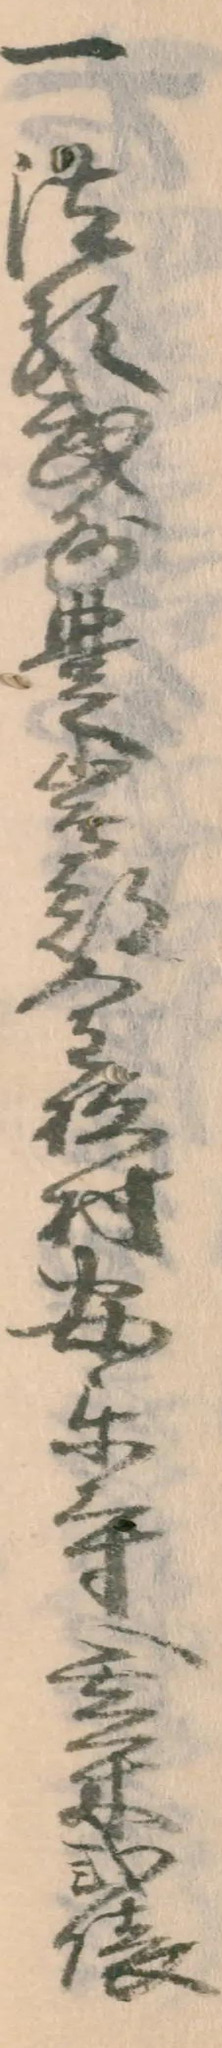一法類武州豊島郡金杉村安楽寺へ玄米弐俵
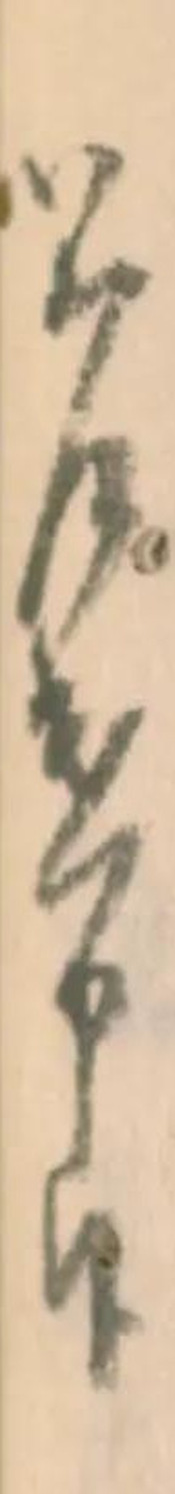差遣申候
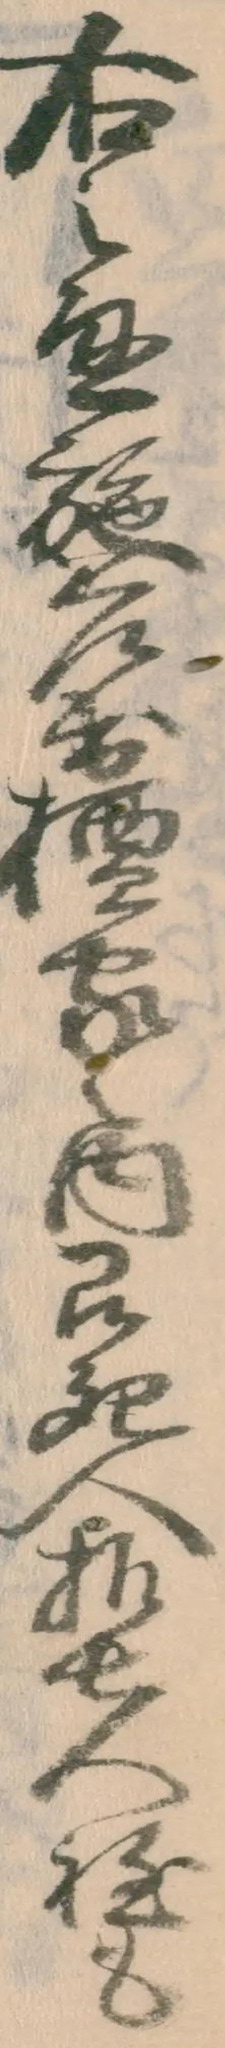右之通施差出檀家之内即死人拾七人程も
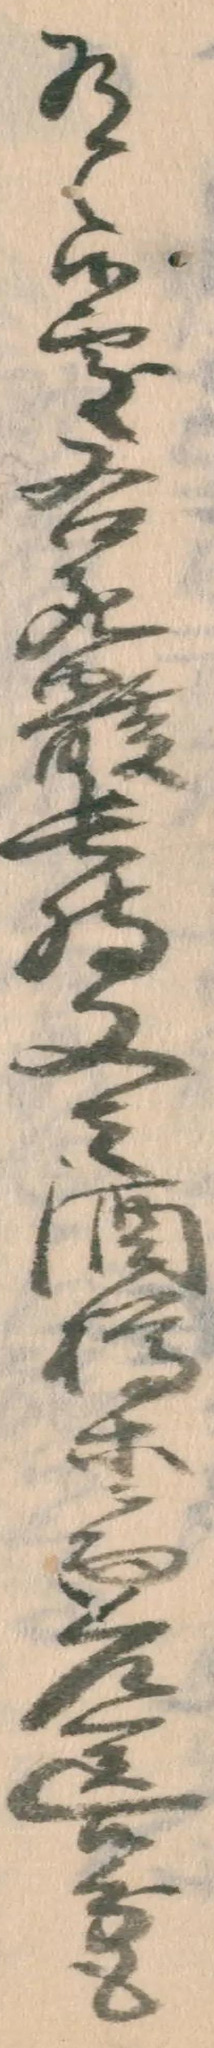有之候処右死骸長持又は酒樽等ニ而差送候分も
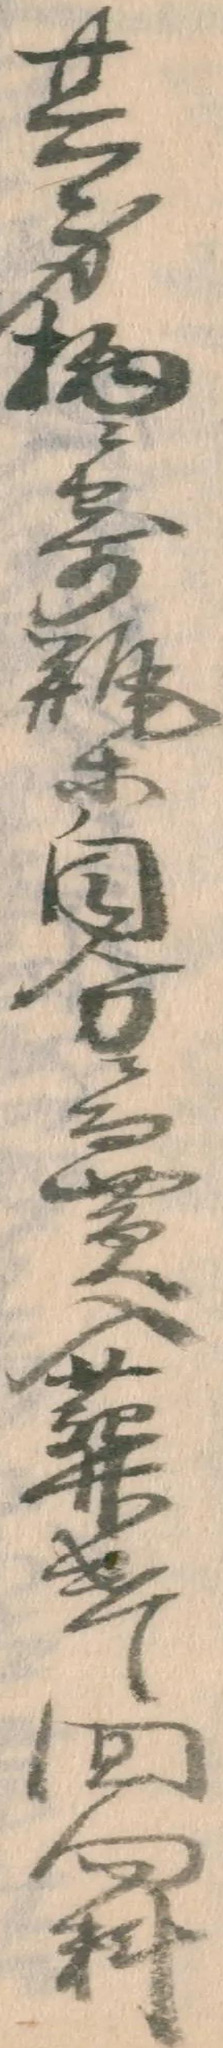其身柄ニ寄瓶等自分ニ而買入葬遣し回向料
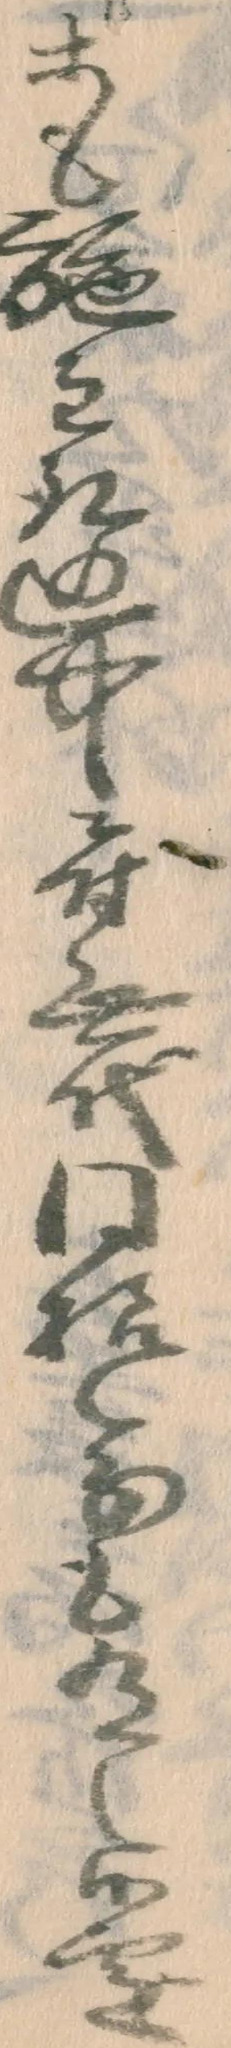等も施主取込中ニ付無代同様之分も有之候処
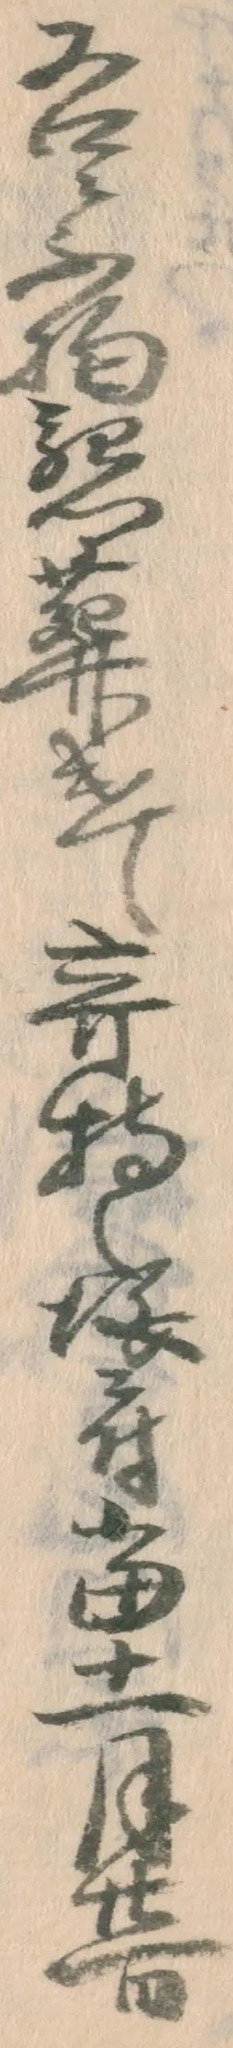右ニ不拘懇葬遣し奇特之儀ニ付当十一月廿一日
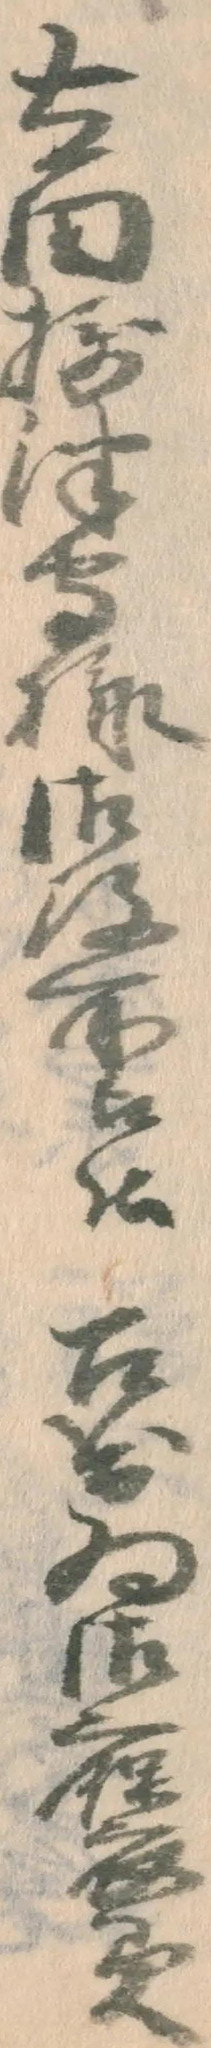太田摂津守様御役所え被召出為御褒美
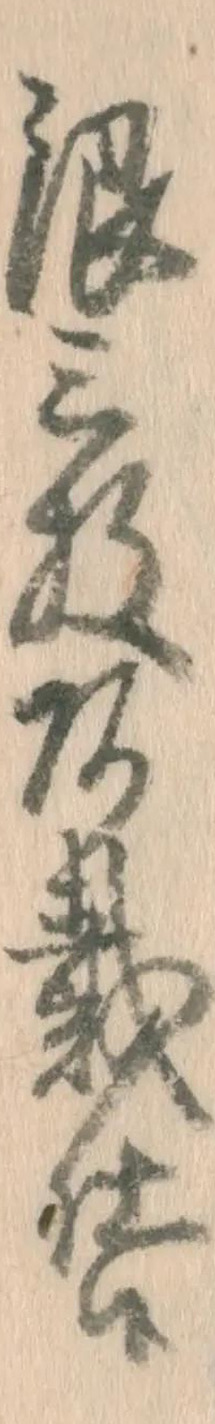銀三枚頂戴仕候

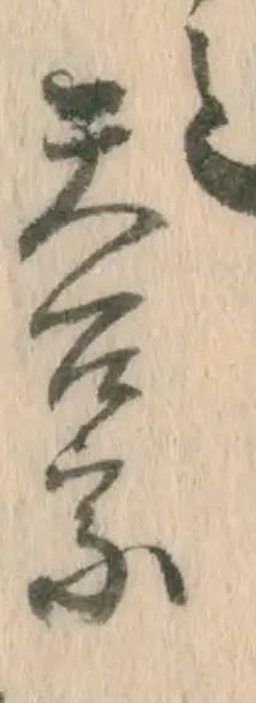天台宗
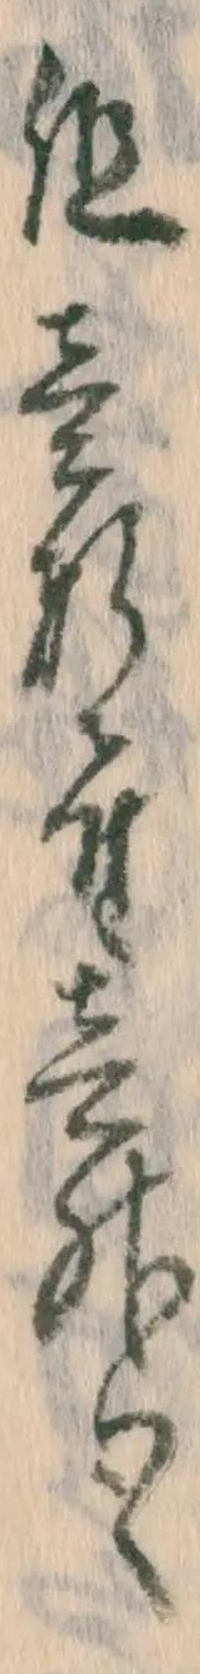但壱軒ニ付壱升ツヽ
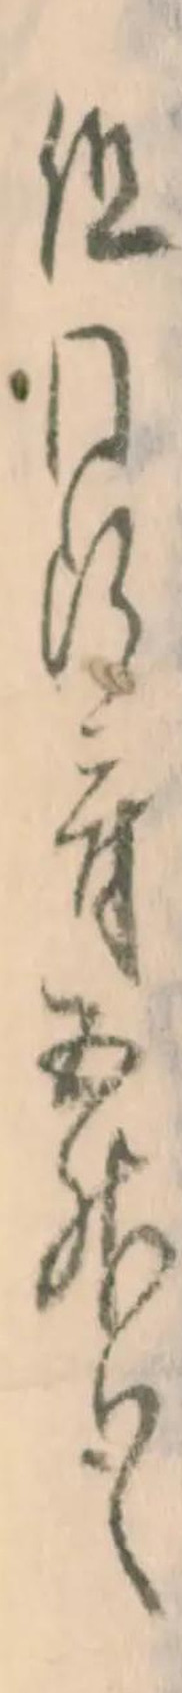但同断ニ付五升ツヽ
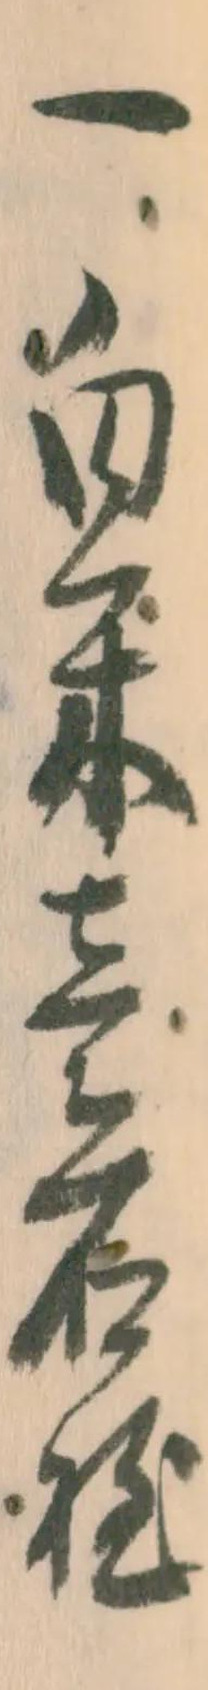一白米壱石程
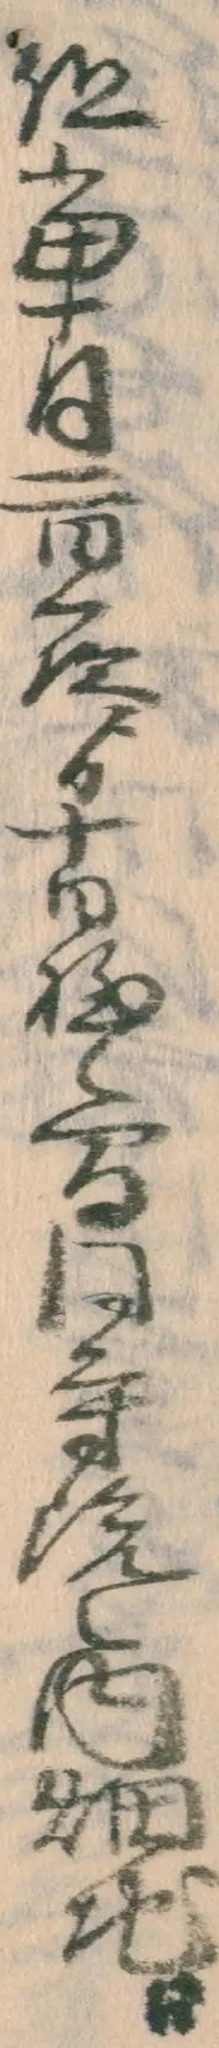但当十月二日夜ゟ十日程之間同寺院之内畑地え
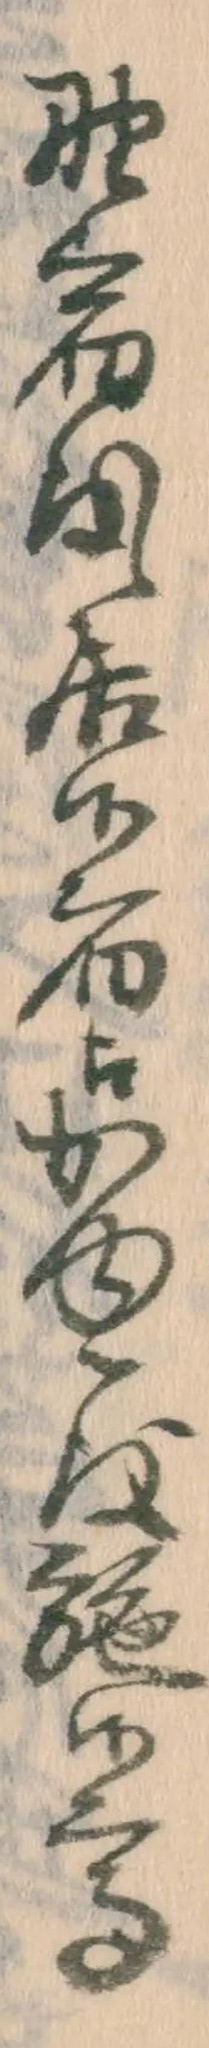野宿致居候者えかゆ致施候高
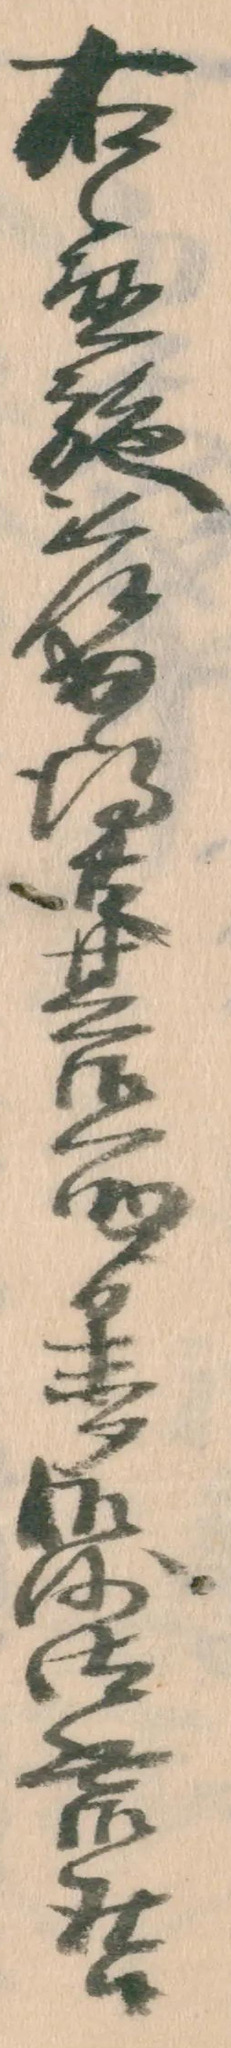右之通施差出候得共其御筋ゟ未タ御沙汰無御座候
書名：武家方并寺院等ニテ施差出候一件
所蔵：国立国会図書館 National Diet Library, JAPAN
